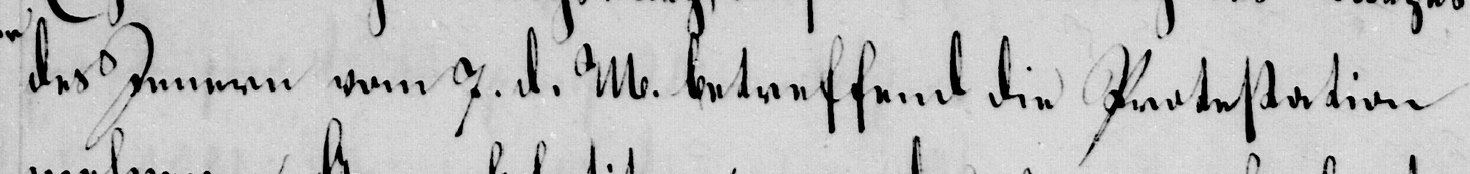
des Innern vom 7. d. M. betreffend die Protestation
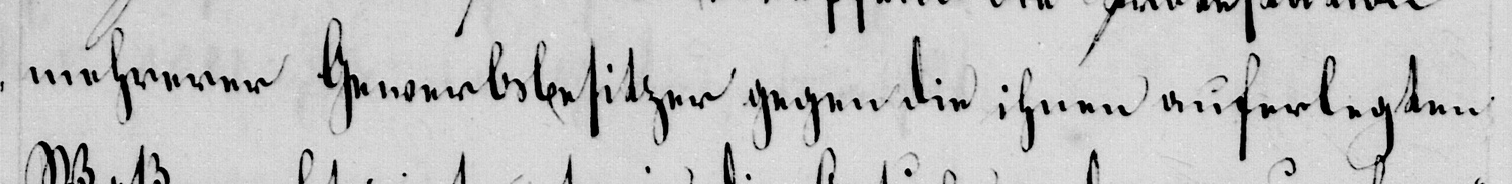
mehrerer Gewerbsbesitzer gegen die ihnen auferlegten
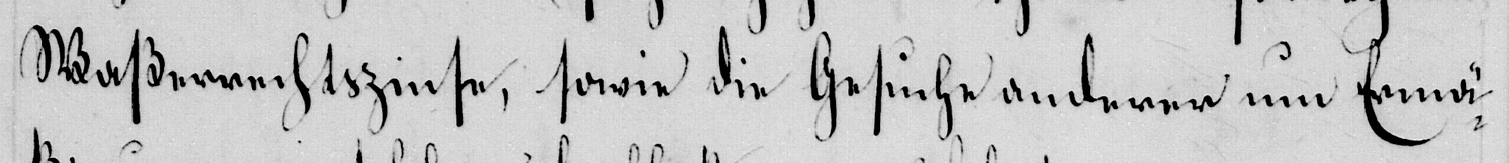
Waßerrechtszinse, sowie die Gesuche anderer um Ermä¬
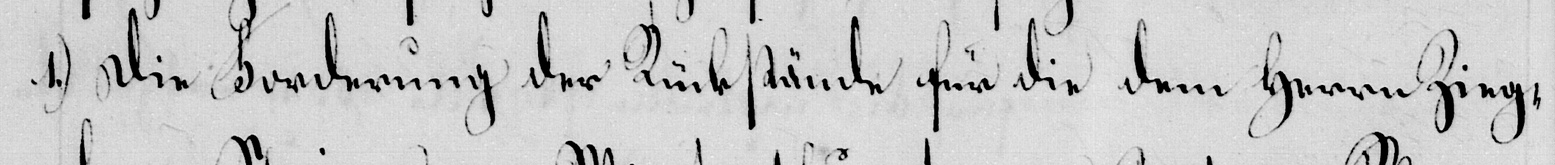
1.) Die Forderung der Rückstände für die dem Herrn Zieg¬
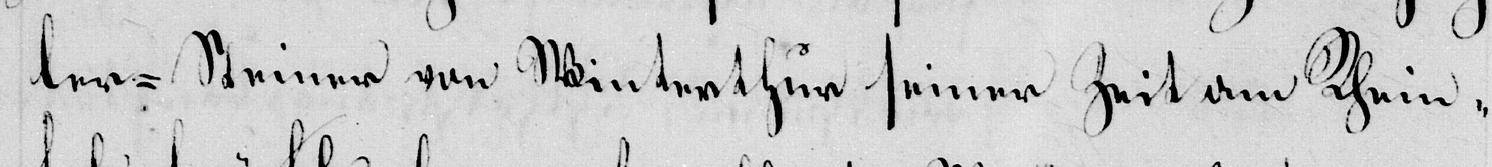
ler-Steiner von Winterthur seiner Zeit am Rhein¬
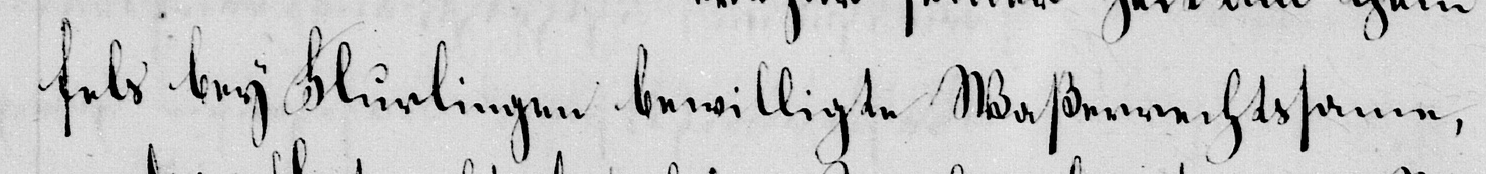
fels bey Flurlingen bewilligte Waßerrechtsame,
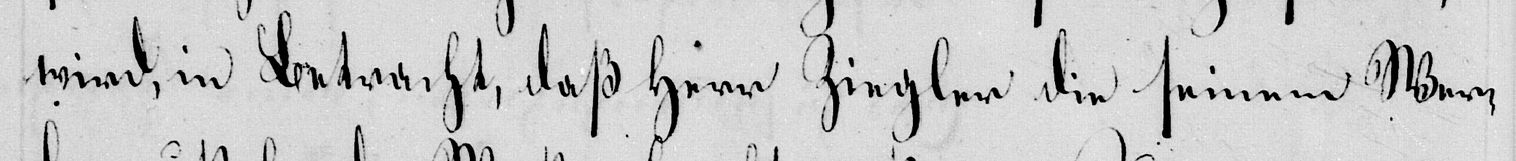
wird, in Betracht, daß Herr Ziegler die seinem Wer¬
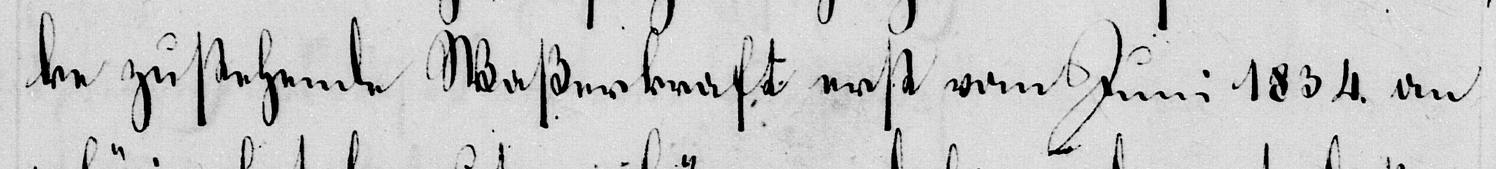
ke zustehende Waßerkraft erst vom Juni 1834. an
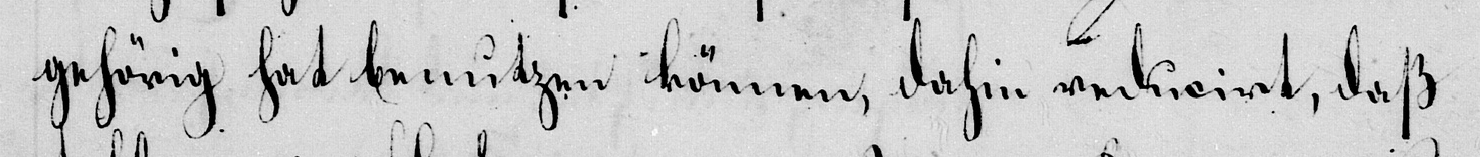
gehörig hat benutzen können, dahin reducirt, daß
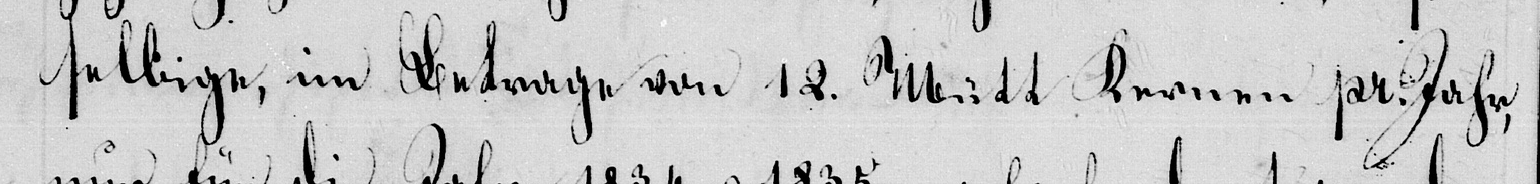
selbige im Betrage von 12. Mütt Kernen pr. Jahr,
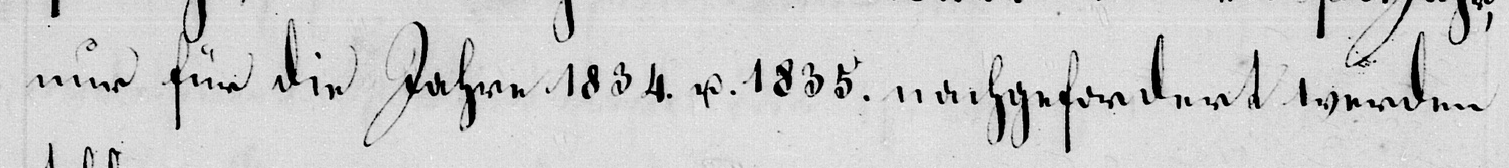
nur für die Jahre 1834. u. 1835. nachgefordert werden
